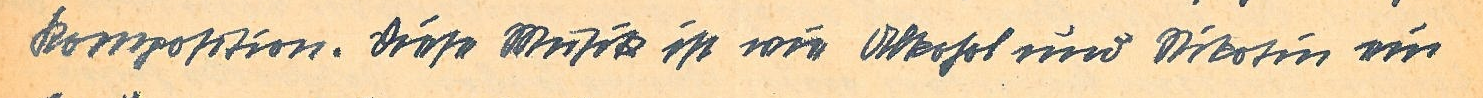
Komposition. Diese Musik ist wie Alkohol und Nikotin ein
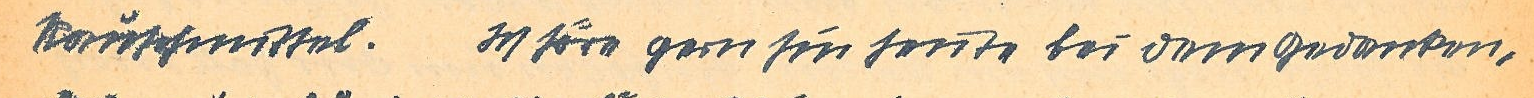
Rauschmittel. Ich höre gern hin heute bei dem Gedanken,
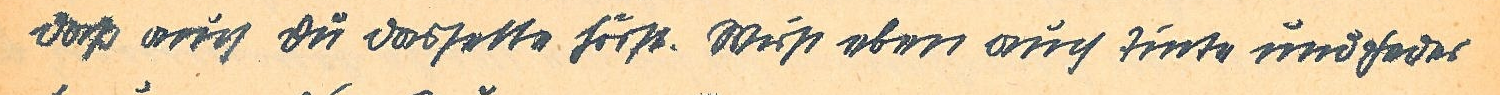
daß auch Du dasselbe hörst. Wirst eben auch Tinte und Feder
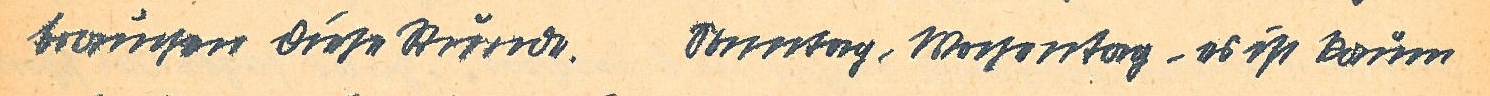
brauchen diese Stunde. Sonntag, Wochentag, es ist kaum
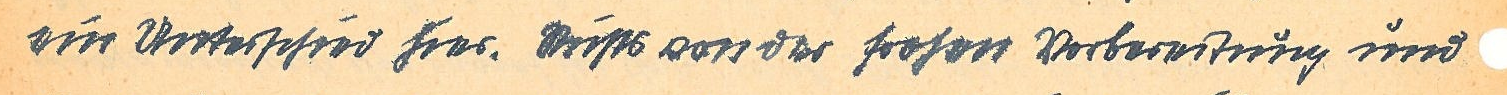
ein Unterschied hier. Nichts von der frohen Vorbereitung und
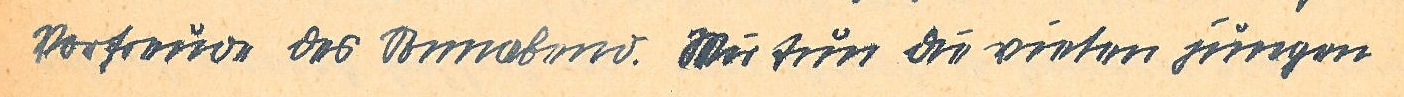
Vorfreude des Sonnabend. Mir tun die vielen jungen
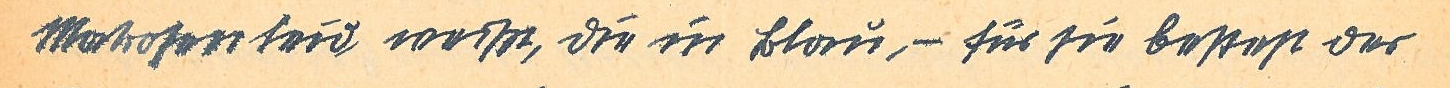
Matrosen leid, weißt, die in Blau, – für sie besteht der
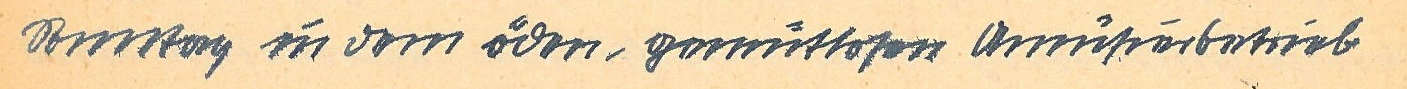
Sonntag in dem öden, gemütlosen Amüsierbetrieb
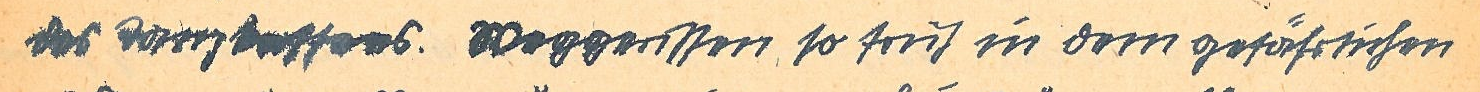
des Tanzs. Weggerissen so früh in dem gefährlichen
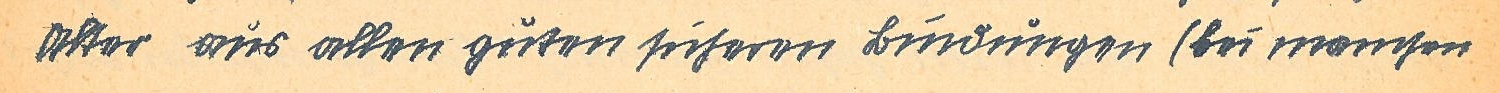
Alter aus allen guten sicheren Bindungen (bei manchen
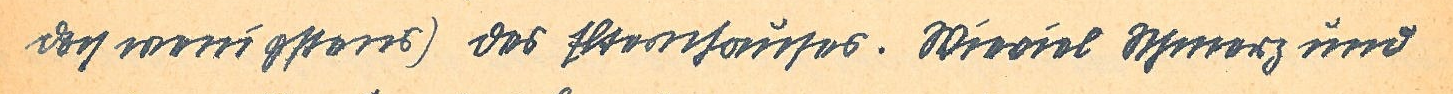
doch wenigstens) des Elternhauses. Wieviel Schmerz und
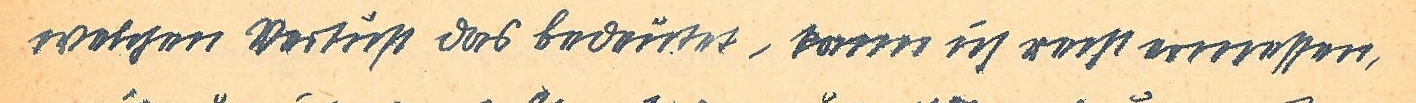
welchen Verlust das bedeutet, kann ich recht ermessen,
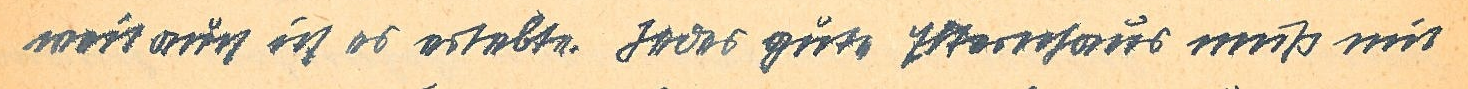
weil auch ich es erlebte. Jedes gute Elternhaus muß mit
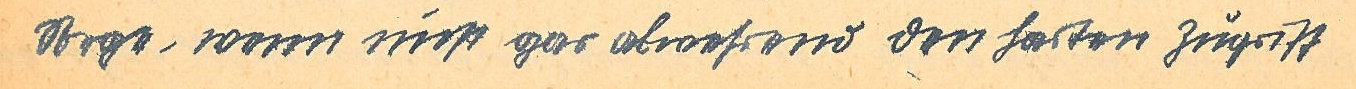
Sorge, wenn nicht gar abwehrend den harten Zugriff
